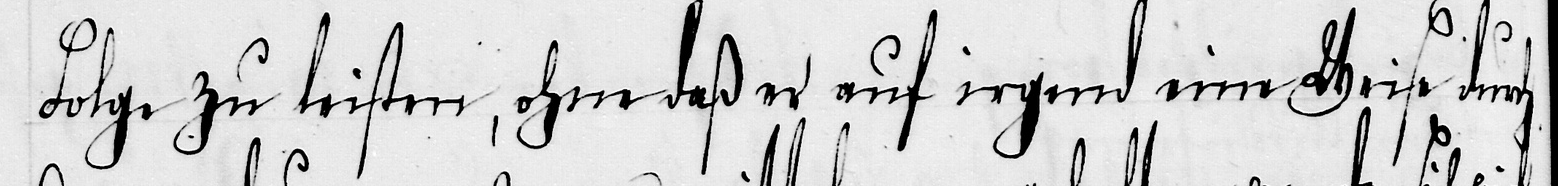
Folge zu leisten, ohne daß er auf irgend eine Weise durch
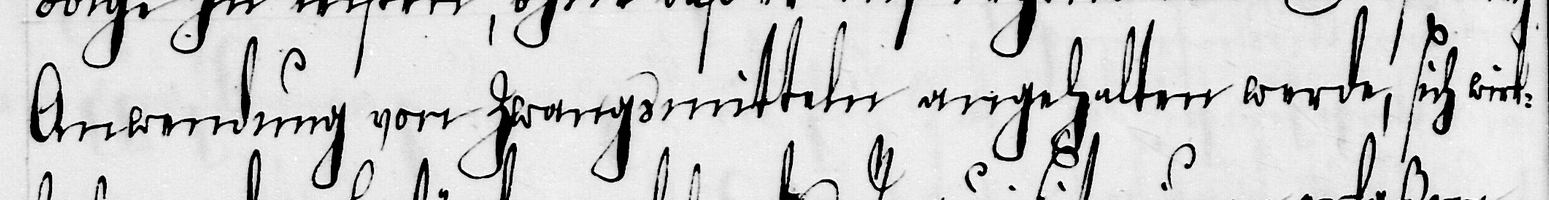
Anwendung von Zwangsmitteln angehalten werde, sich wi¬
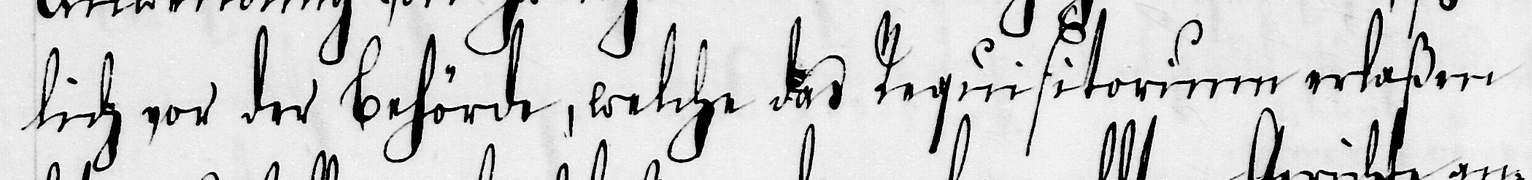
lich vor der Behörde, welche das Requisitorium erlaßen
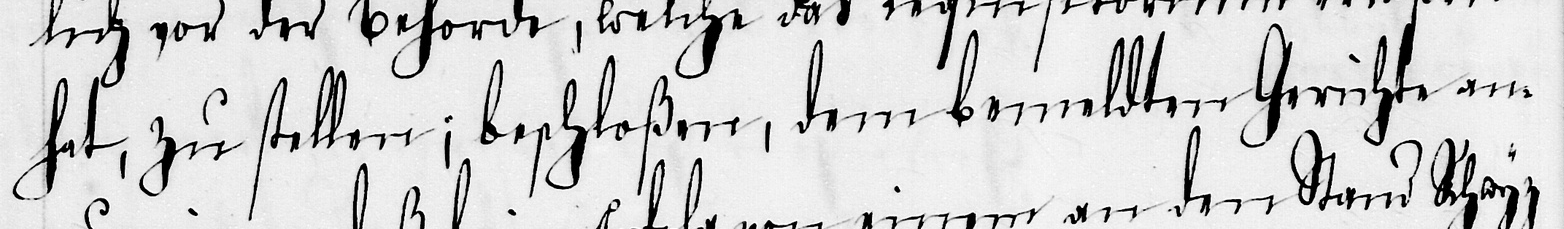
hat, zu stellen; beschloßen, dem bemeldten Gerichte an¬
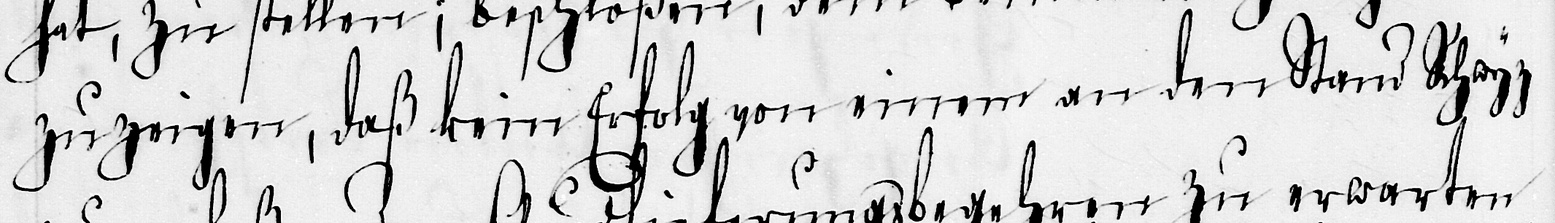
zuzeigen, daß kein Erfolg von einem an den Stand Schwyz
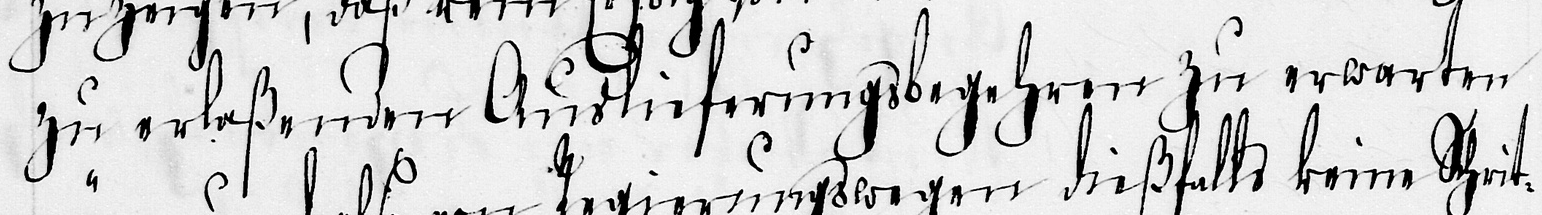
zu erlaßenden Auslieferungsbegehren zu erwarten
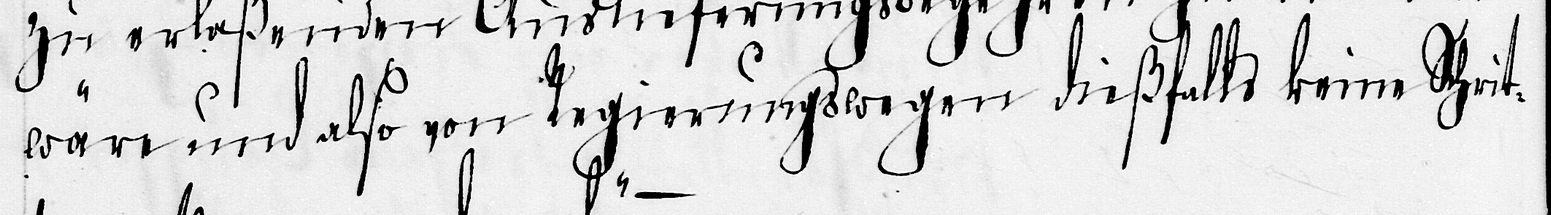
wäre und also von Regierungswegen dießfalls keine Schri¬
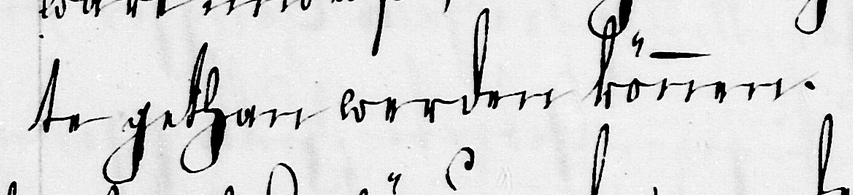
tte gethan werden können.
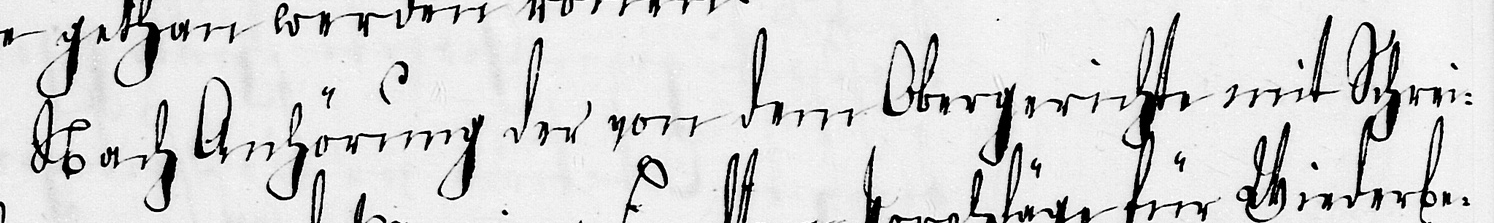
Nach Anhörung der von dem Obergerichte mit Schrei¬
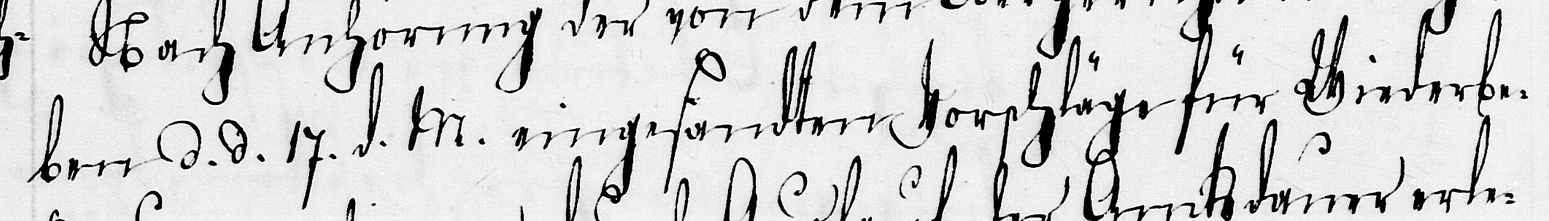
ben d. d. 17. d. M. eingesandten Vorschläge für Wiederbe¬
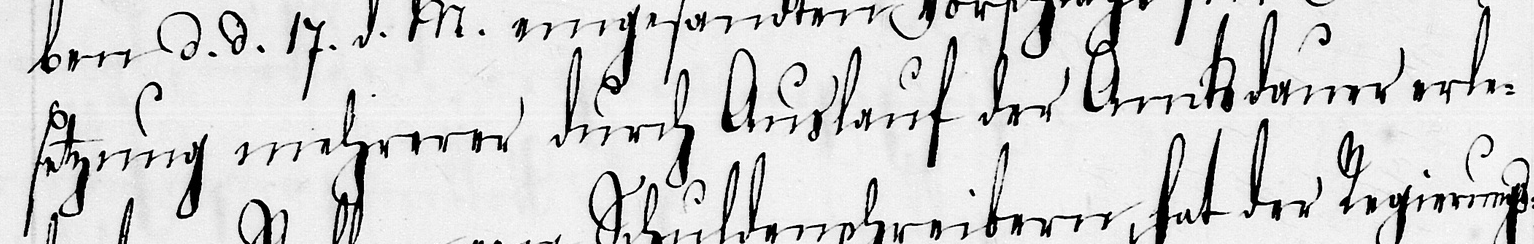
setzung mehrerer durch Auslauf der Amtsdauer erle¬
